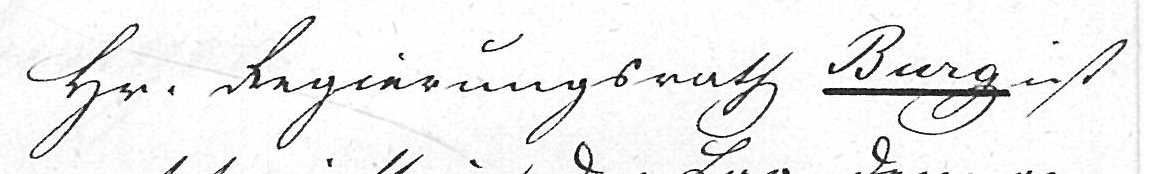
Hr. Regierungsrath Burg ist
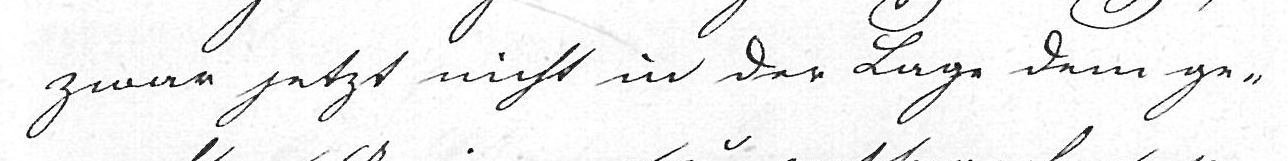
zwar jetzt nicht in der Lage dem ge-
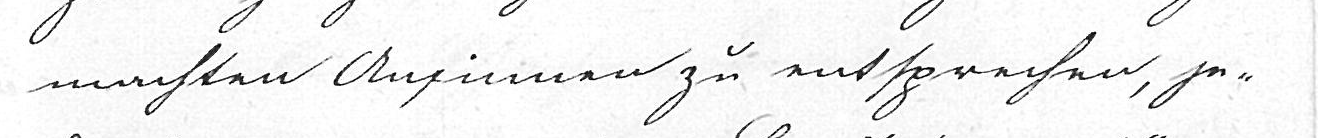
machte Ansinnen zu entsprechen, je-
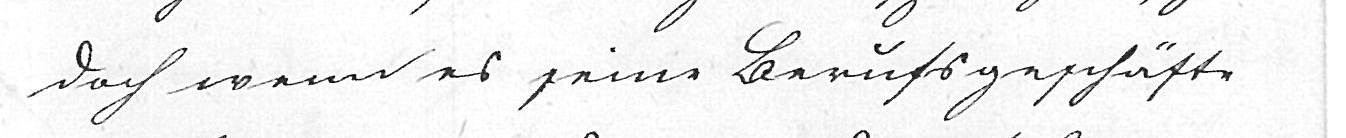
doch wenn es seine Berufsgeschäfte
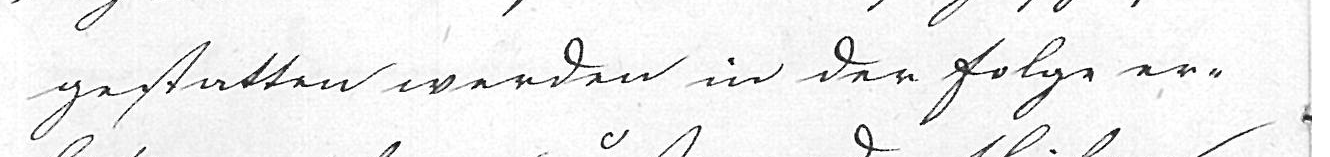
gestatten werden in der Folge er-
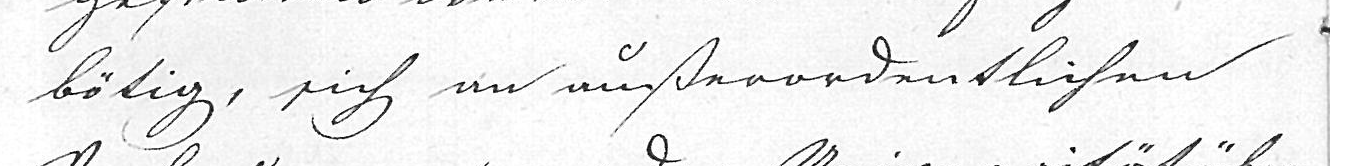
bötig, sich an außerordentlichen
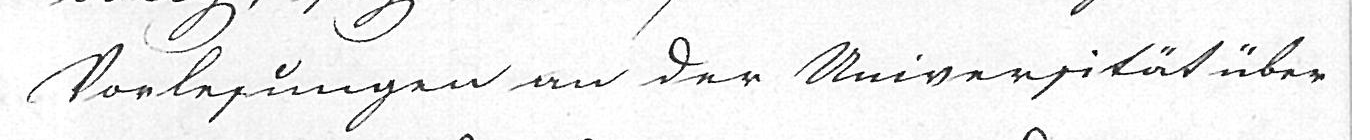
Vorlesungen an der Universität über
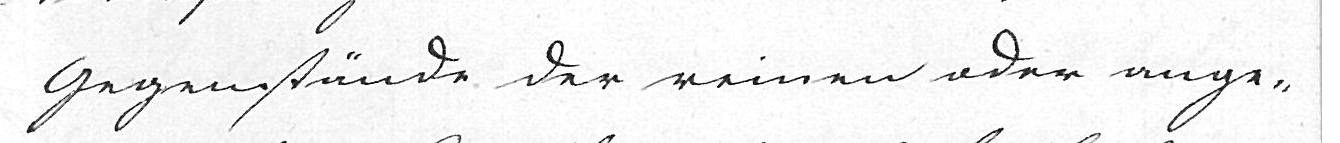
Gegenstände der reinen oder ange-
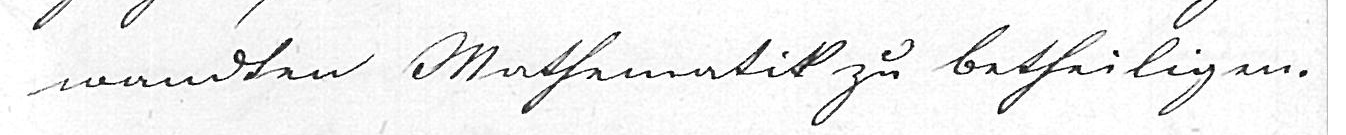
wandten Mathematik zu betheiligen.
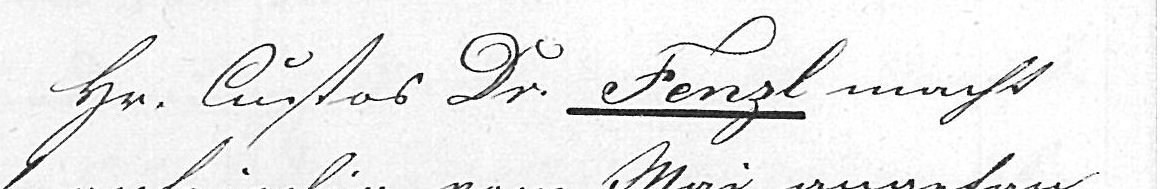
Hr. Custos Dr. Fenzl macht
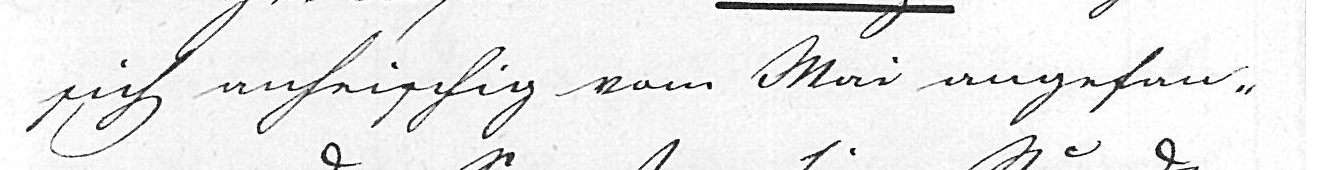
sich anheischig vom Mai angefan-
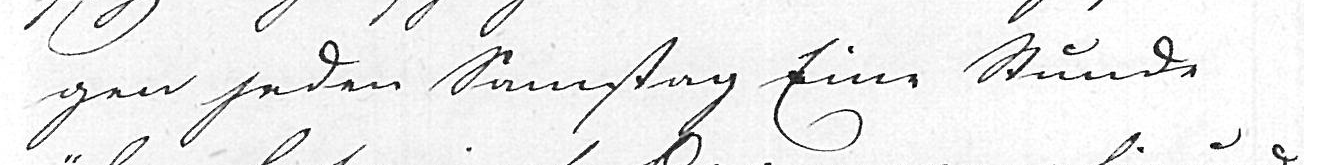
gen jedem Samstag Eine Stunde
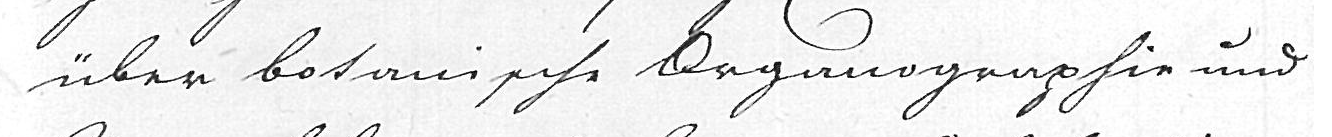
über botanische Organographie nd
